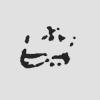爲
